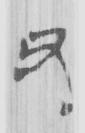父
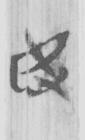奴
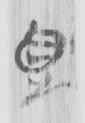見
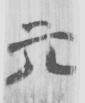亓
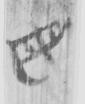母
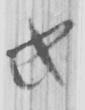女
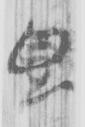見
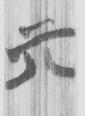亓
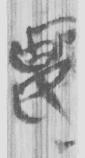妻
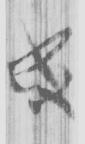奴
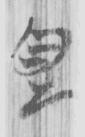見
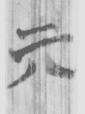亓
